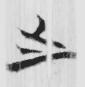之
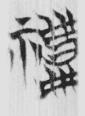{示巤}
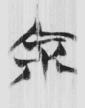余
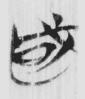或
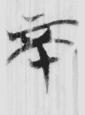不
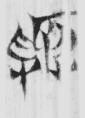與
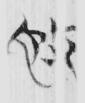{它攴}
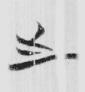之
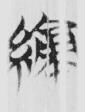{糸朿}
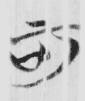可
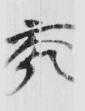而
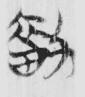{衣田力}
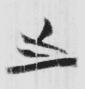之
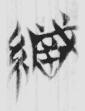織
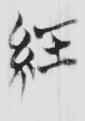紝
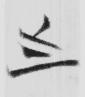之
